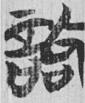詞（治）
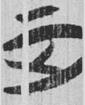正（政）
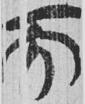而
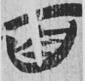百
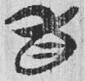眚（姓）
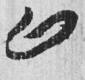㠯（以）
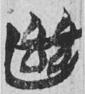○（絕）
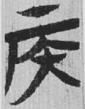侯
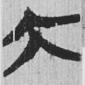大（太）
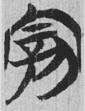○（宰）
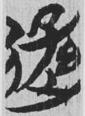遜
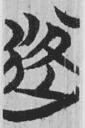○（返）
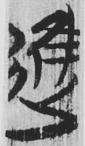進
